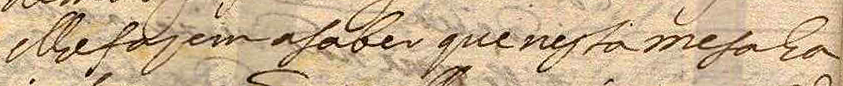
e lhe fazem a saber que nesta mesa ha
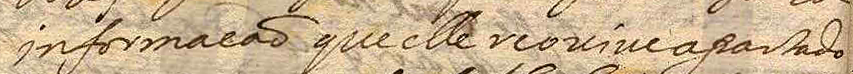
informaçaõ que elle reo uiue apartado
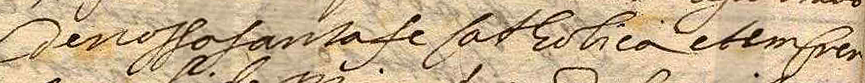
de nossa santa fe Catholica e tem Cren
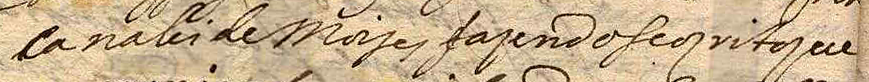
ça na lei de moises fazendo seoz ritoz e ce
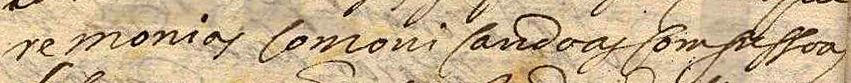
remonias ComoniCandoas Com pessoas
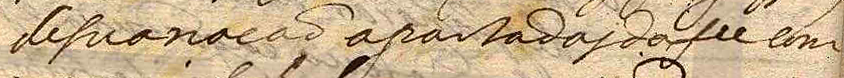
de sua naçaõ apartadas da fee com
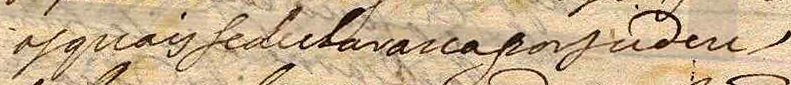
as quais se declaraua por judeu /
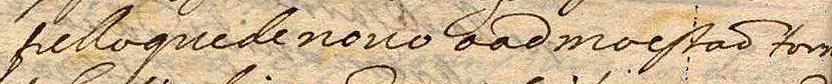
pello que de nouo o admoestaõ torn
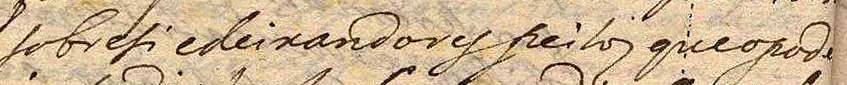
sobre si e deixando respeitoz que o pode
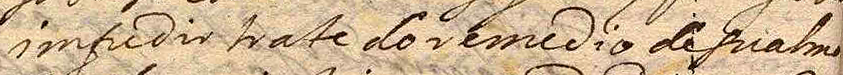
impedir trate do remedio de sualma
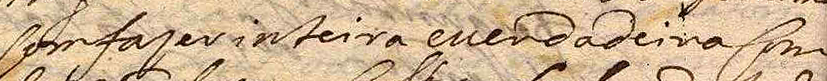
Com fazer inteira e uerdadeira Com
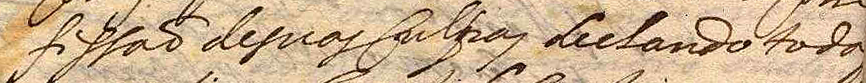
fissaõ de suas Culpas declando toda
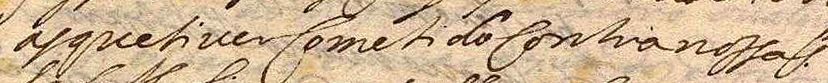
as que tiuer Cometido Contra nossa s.ta
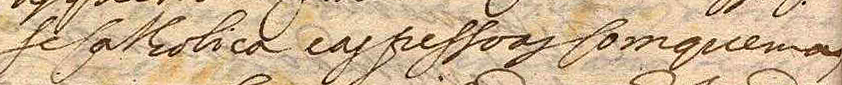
fe Catholica e as pessoas Com quem as
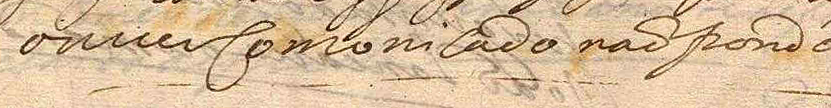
ouuer Comonicado naõ pondo
